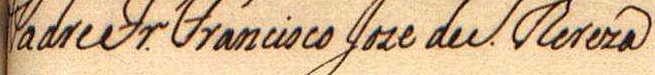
Padre Fr. Francisco Joze de S. Thereza
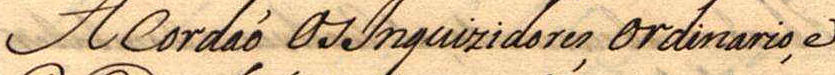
Acordaõ os Inquizidores, Ordinario e
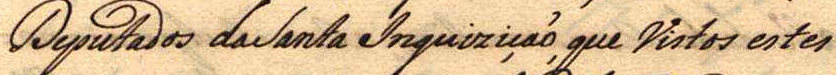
Deputados da Santa Inquiziçaõ, que Vistos estes
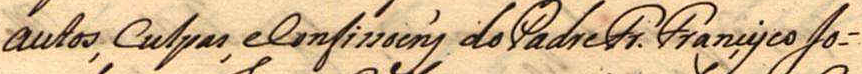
autos, Culpas, e Confissoen̄s, do Padre Fr. Françisco Jo
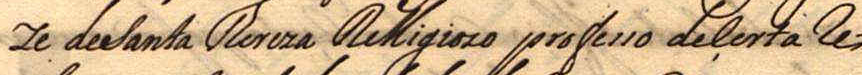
ze de Santa Thereza Relligiozo professo de Çerta Re
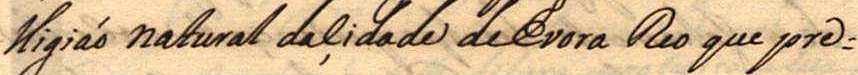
lligião natural da Çidade Evora Reo que pre
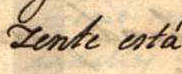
zente está
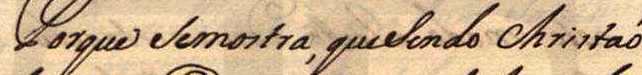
Porque se mostra, que Sendo christaõ,
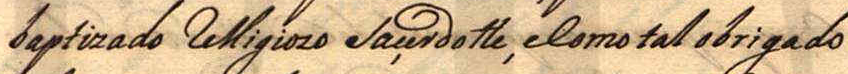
baptizado, Relligiozo saçerdotte, e Como tal obrigado
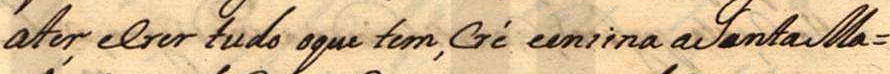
a ter, e Crer tudo o que tem, Cré e ensina a Santa Ma
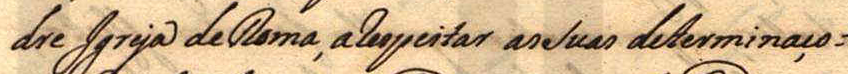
dre Jgreja de Roma, a Respeitar as suas determinaço
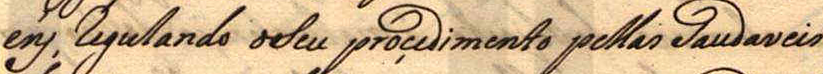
en̄s, Regulando o seu proçedimento pellas Saudaveis
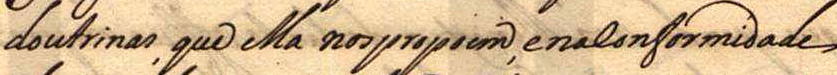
doutrinas, que ella nos propoem, e na conformidade
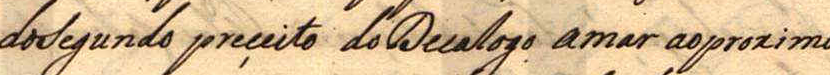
do Segundo preçeito do Decalogo amar ao proximo
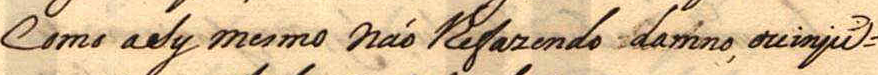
como a Sy mesmo naõ lhe fazendo damno, ou injú
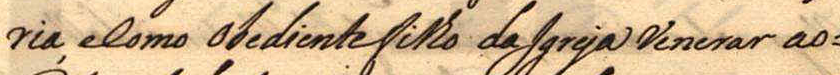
ria, e Como obediente filho da Jgreja Venerar ao
